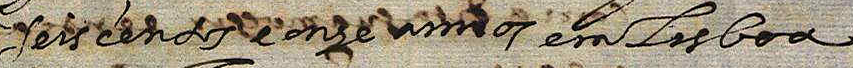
seiscentos e onze annos em Lisboa
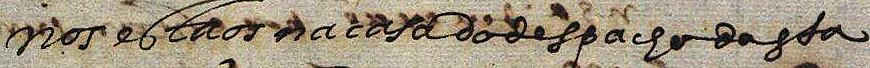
nos estaos na casa do despacho da sta
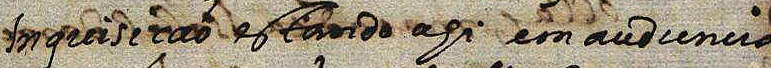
Inquisiçaõ estando ahi em audiencia
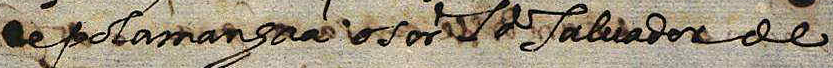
de pola manhaã o sor̄ Ldo Saluador de
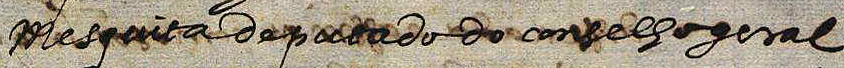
mesquita deputado do conselho geral
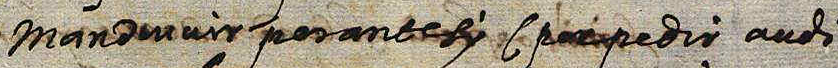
mandou uir perante sy (por pedir audi
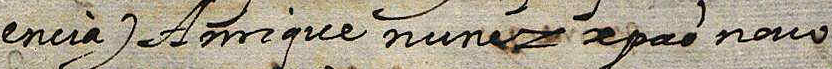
encia) Anrique nunez xpaõ nouo
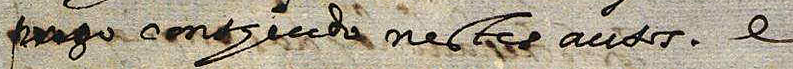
preso contheudo nestes autos. e
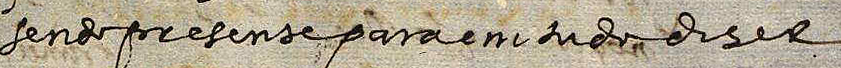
sendo presente para em tudo dizer
